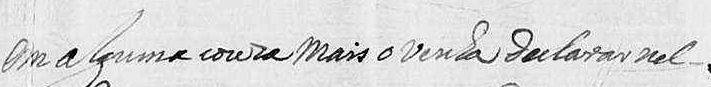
em alguma couza mais o venha declarar nel
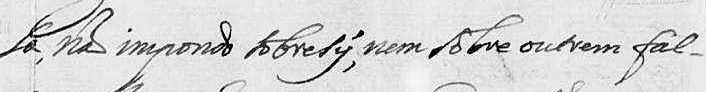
la, naõ impondo sobre sy, nem sobre outrem fal
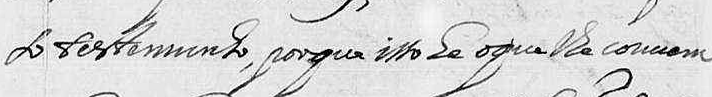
so testemunho, porque isso he o que lhe conuem
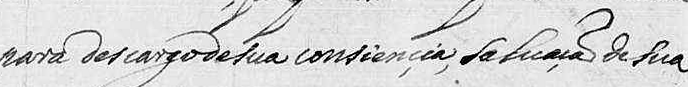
para descargo de sua consiencia, saluação de sua
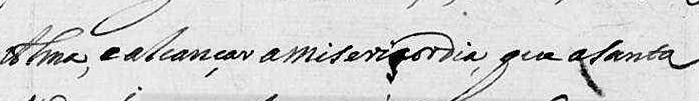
Alma, e alcançar a misericordia, que a santa
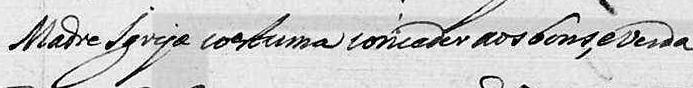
Madre Igreja costuma conceder aos bons, e verda
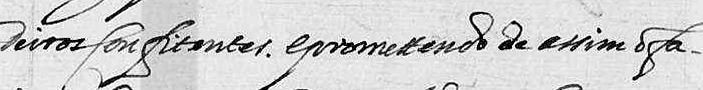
deiros Confitentes. e promettendo de assim o fa
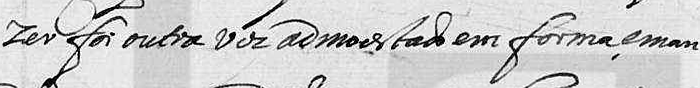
zer foi outra vez admoestado em forma, e man
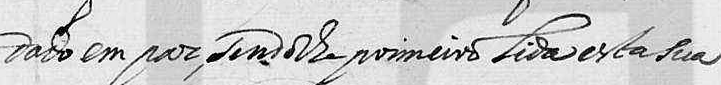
dado em paz, sendolhe primeiro lida esta sua
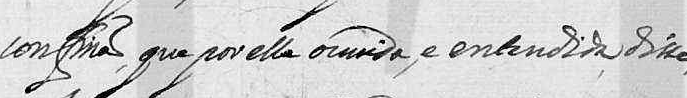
confissaõ, que por ella ouuida, e entendida, disse,
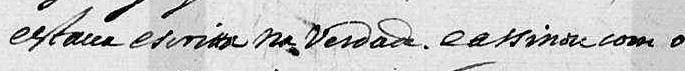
estaua escritta na verdade. e assinou com o
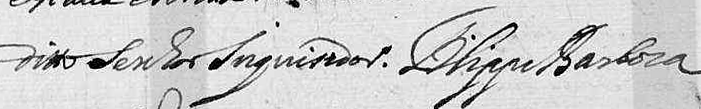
ditto Senhor Inquisidor. Filippe Barboza
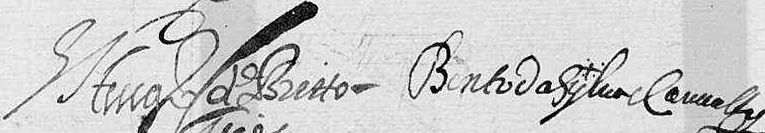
Esteuaõ de Brito - Bento da Sylua Carualho
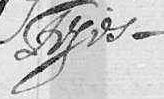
Fojos -
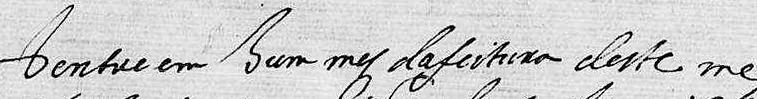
dentre em hum mes da feitura deste me
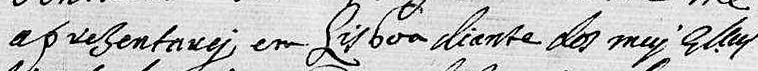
aprezentarej em Lisboa diante dos muj Ellus
